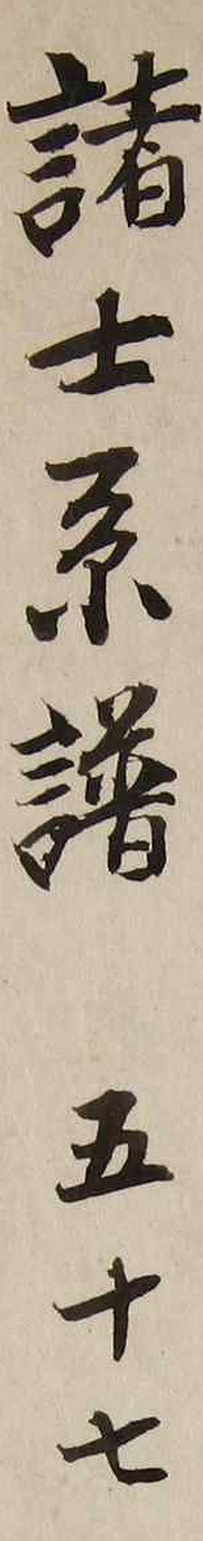諸士系譜五十七

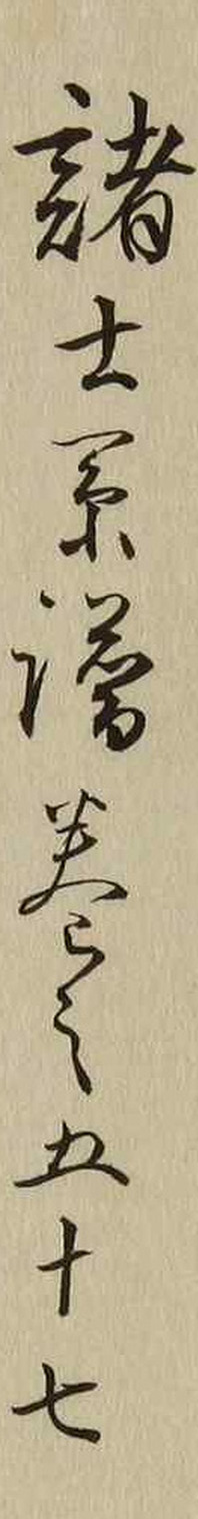諸士系譜巻之五十七
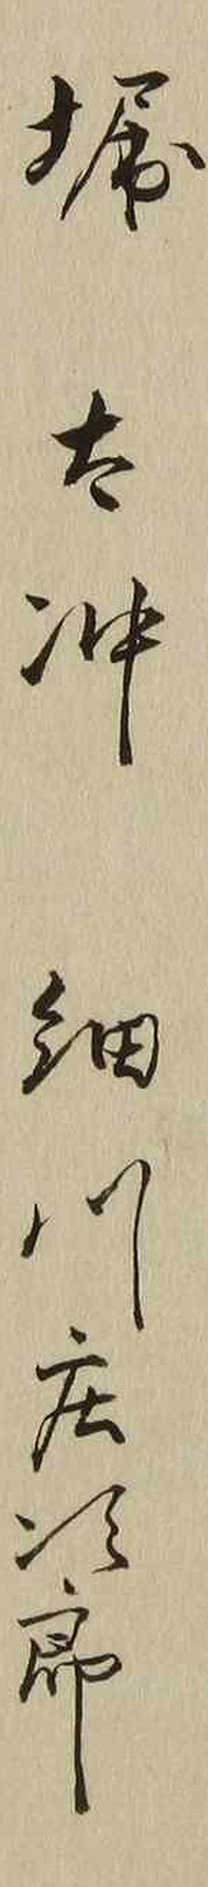堀太冲細川庄次郎
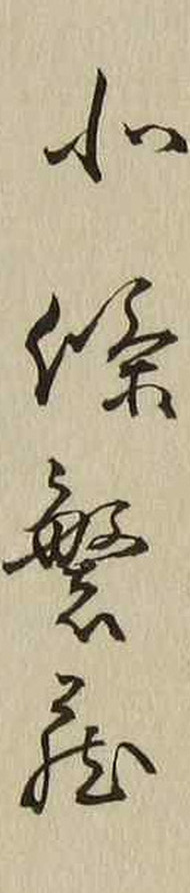北条繁蔵

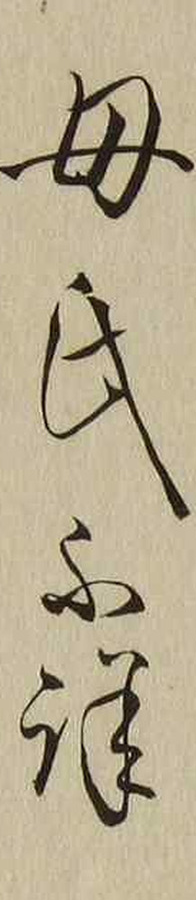母氏不詳
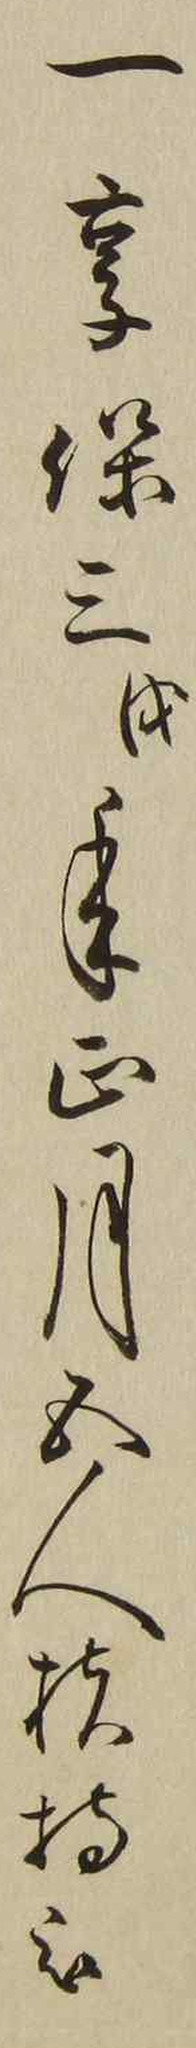一享保三戊年正月五人扶持被

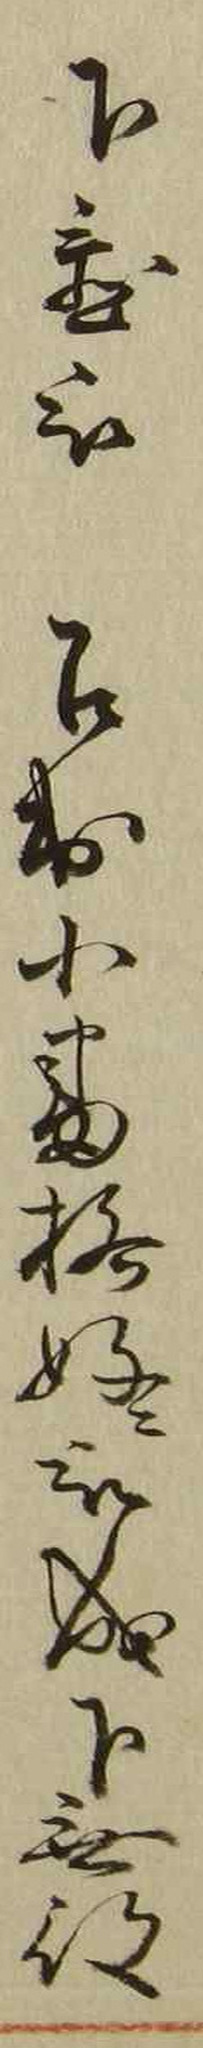下置被召出小番格好ニ被成下無役
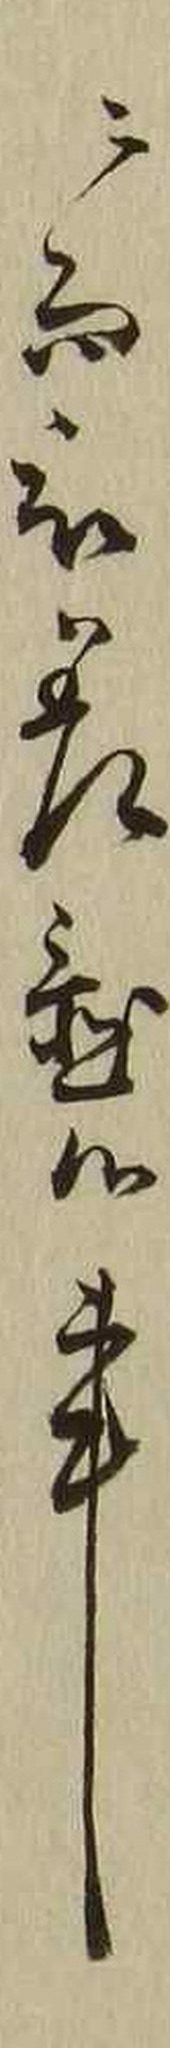ニ而被差置候事
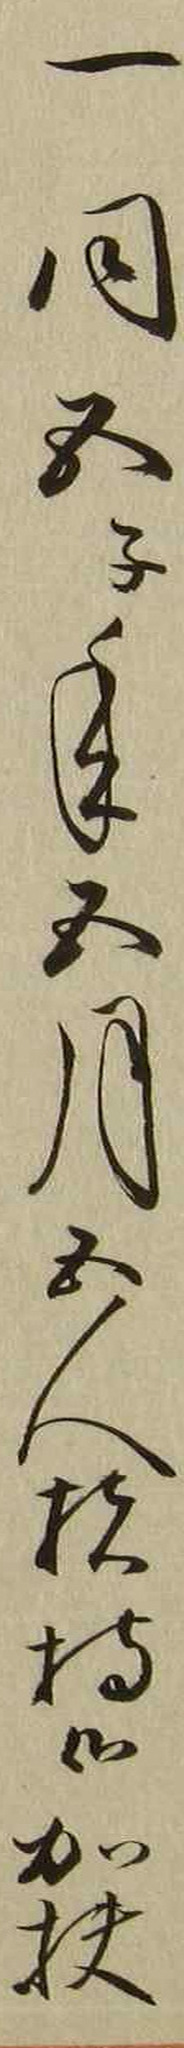一同五子年五月五人扶持御加扶
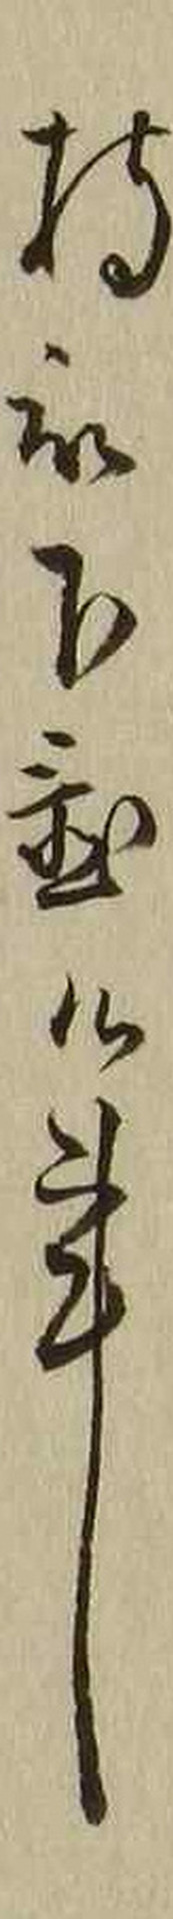持被下置候事
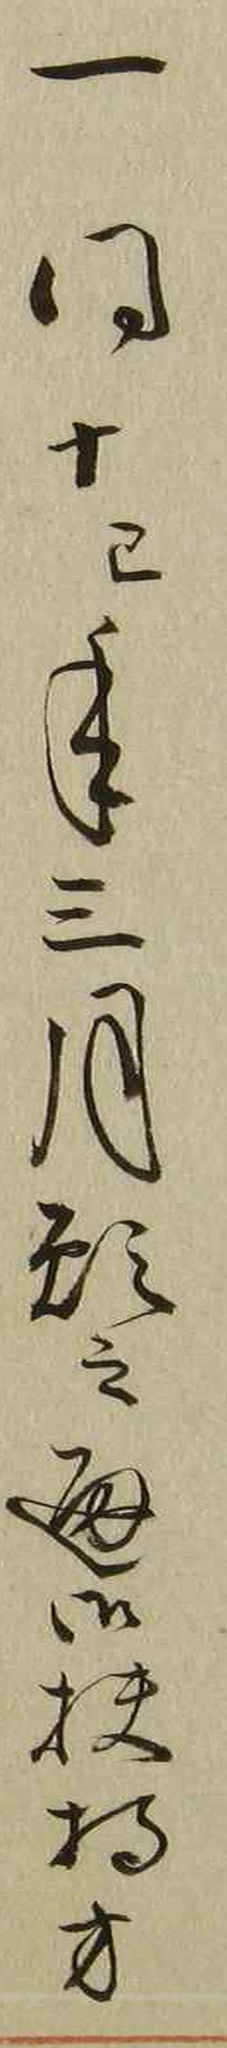一同十巳年三月願之通御扶持方
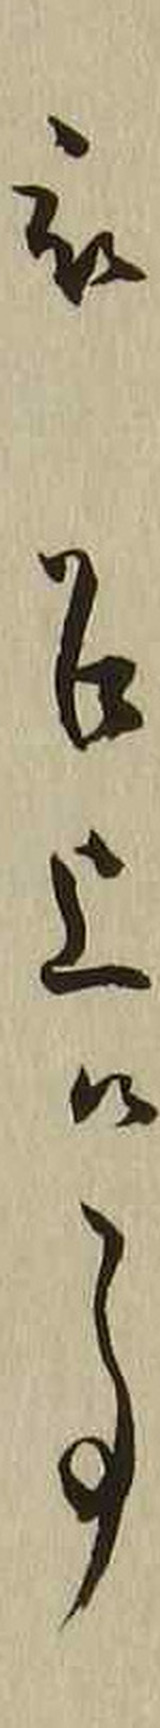被召上候事
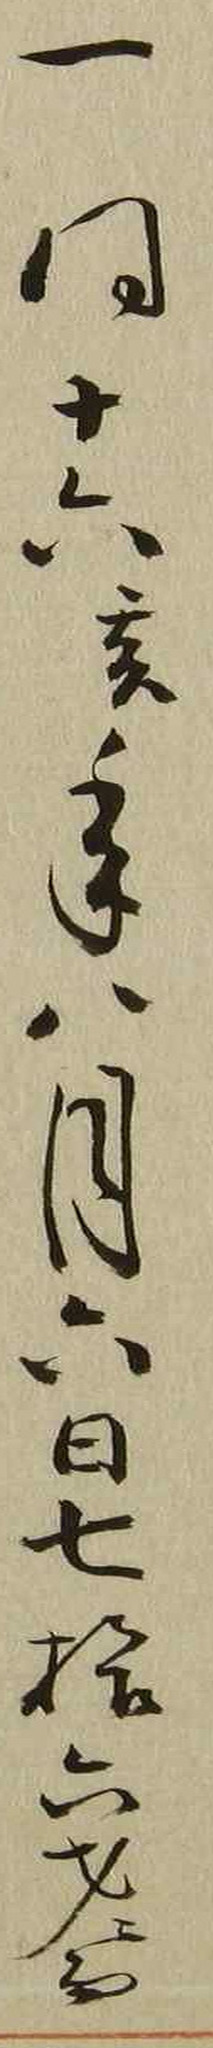一同十六亥年八月六日七拾六才ニ而
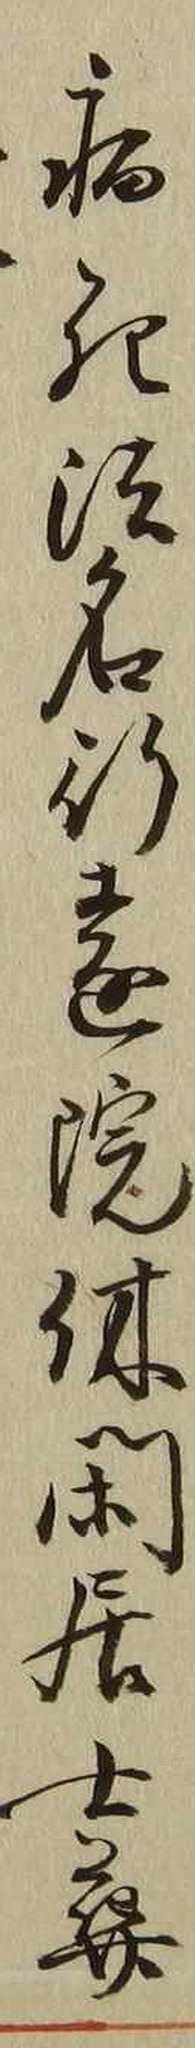病死法名行遠院休閑居士葬
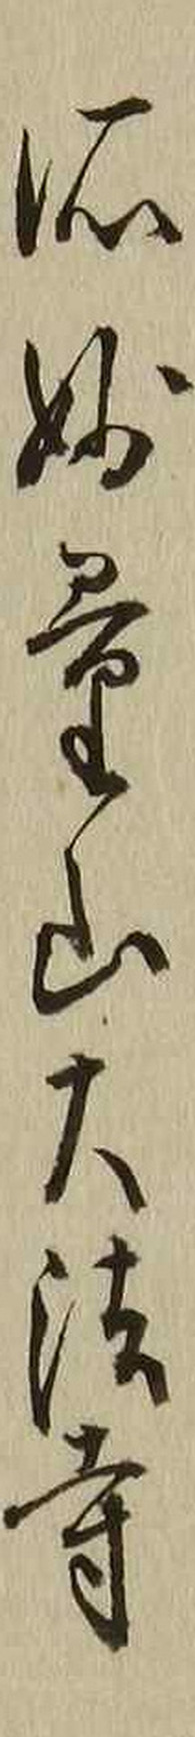所妙量山大法寺
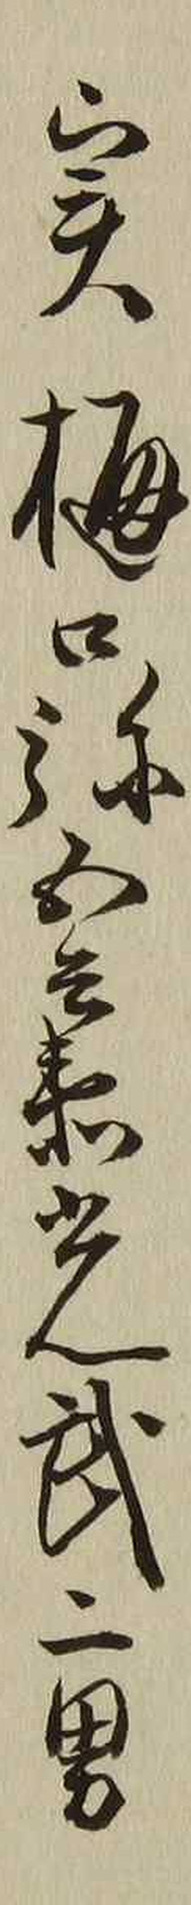実樋口弥五兵衛光武二男
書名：諸士系譜　巻之57　ほ之部4
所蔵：会津若松市立会津図書館
